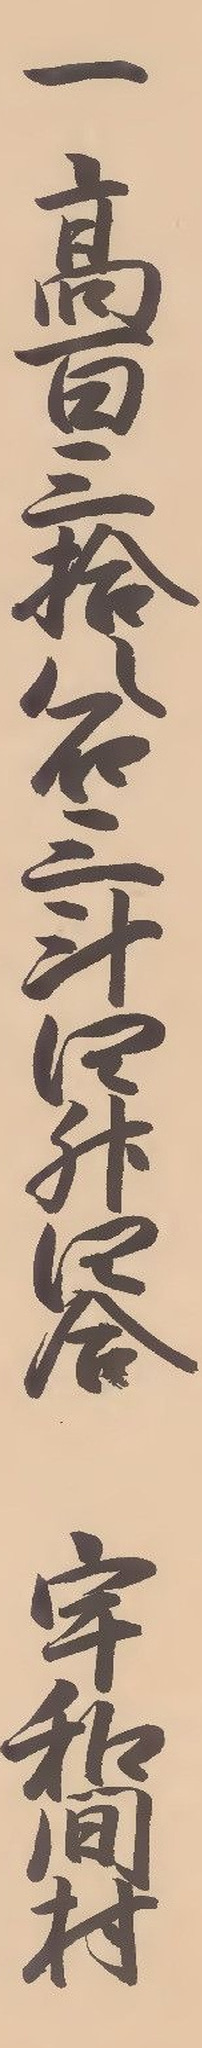一高百三拾八石三斗四升四合宇和間村
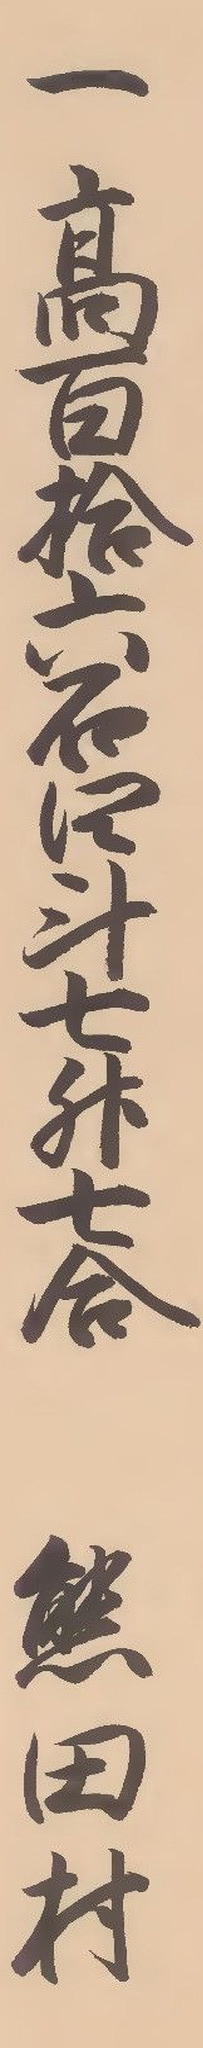一高百拾六石四斗七升七合熊田村
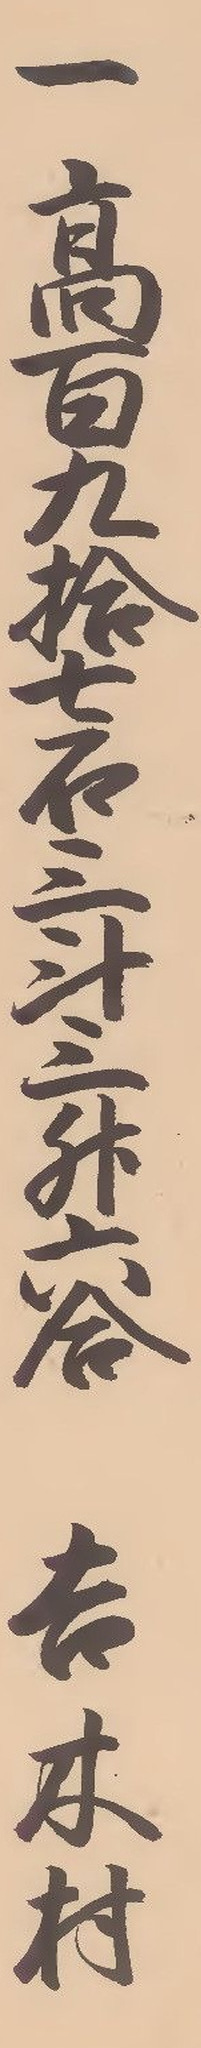一高百九拾七石三斗三升六合吉木村

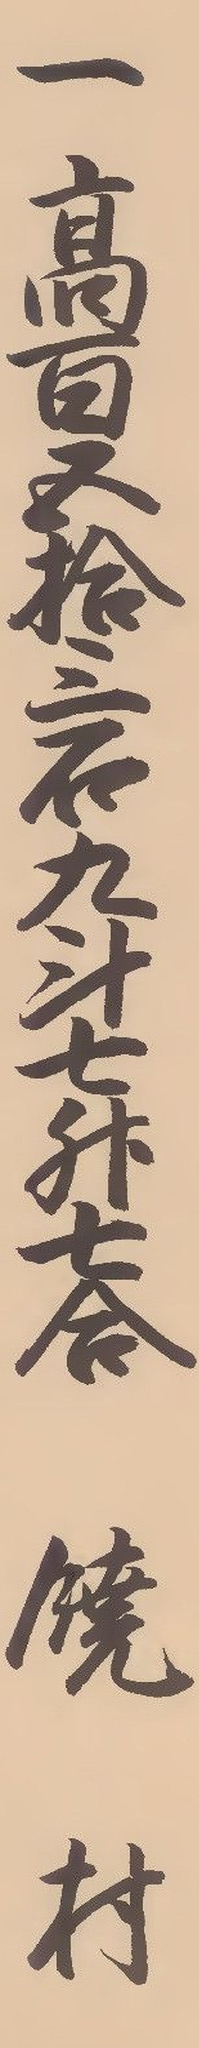一高百五拾三石九斗七升七合饒村
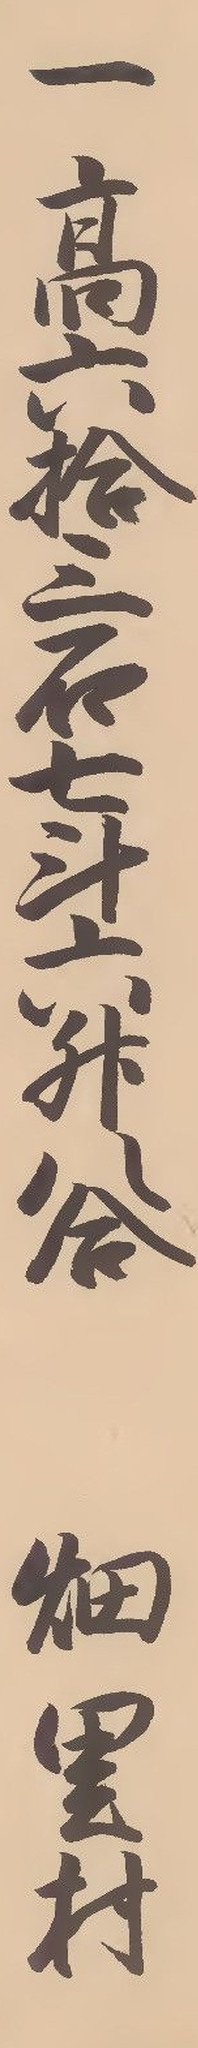一高六拾三石七斗六升八合畑里村
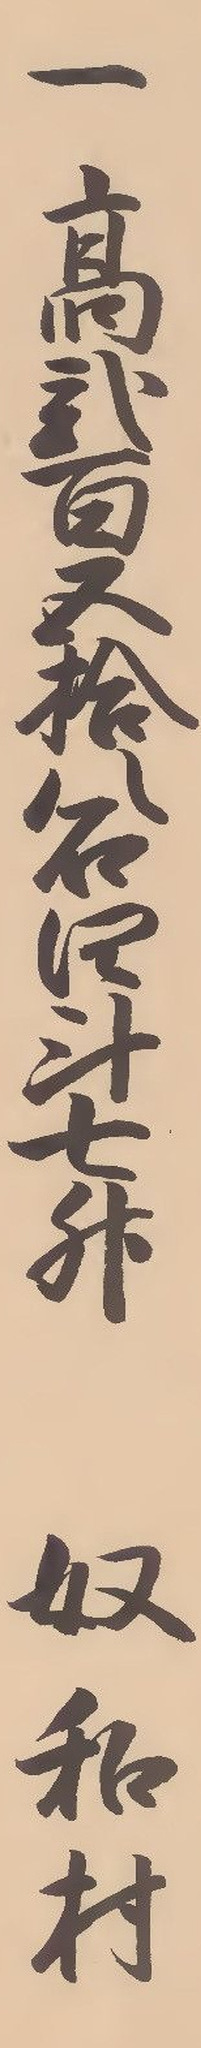一高弐百五拾八石四斗七升奴和村
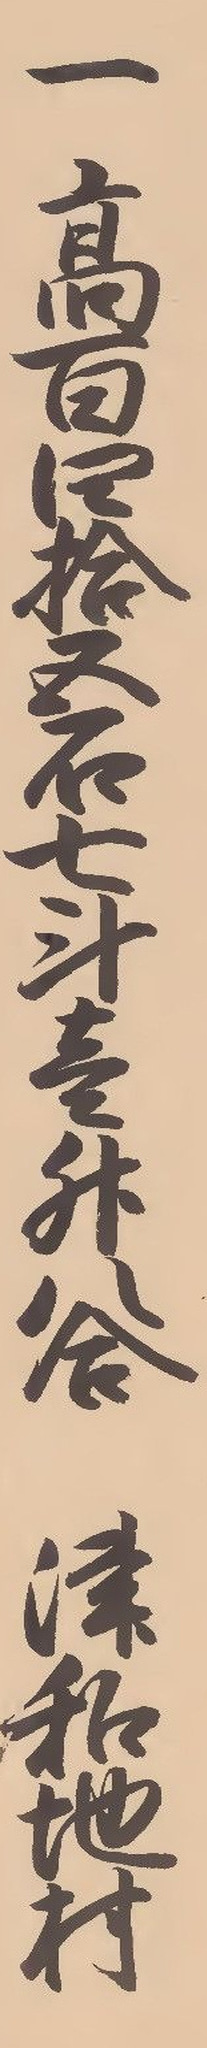一高百四拾五石七斗壱升八合津和地村
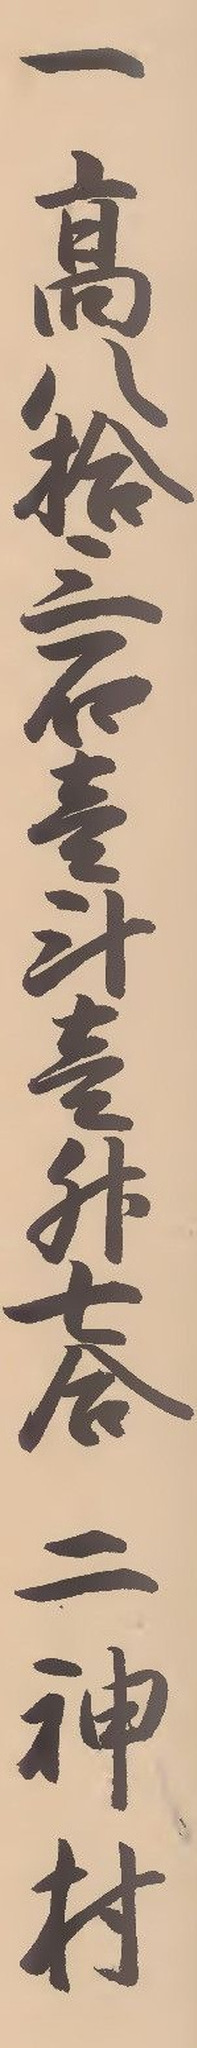一高八拾三石壱斗壱升七合二神村
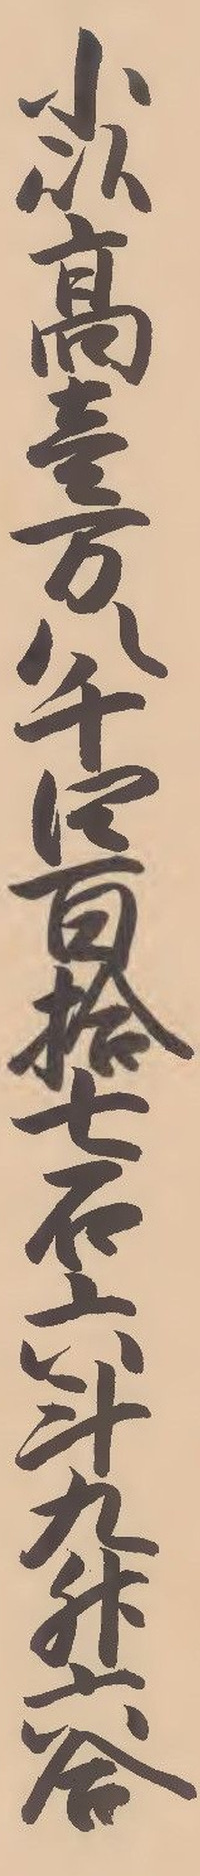小以高壱万八千四百拾七石六斗九升六合

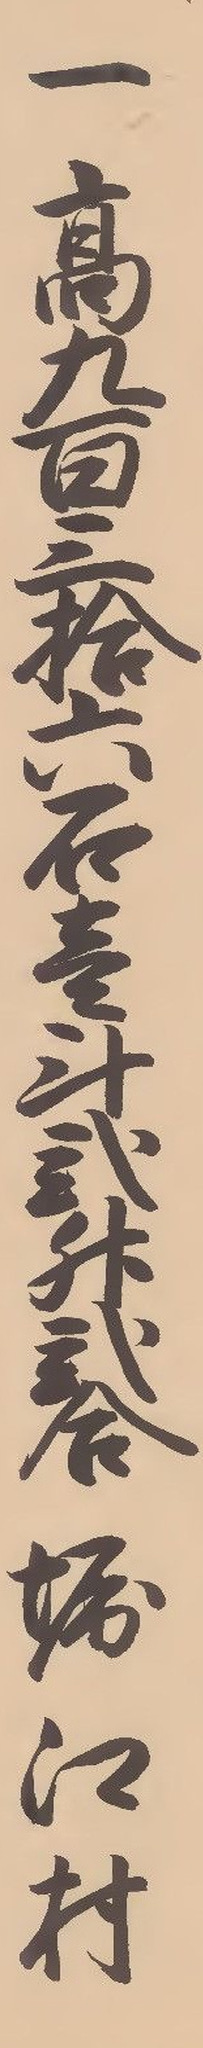一高九百三拾六石壱斗弐升弐合堀江村
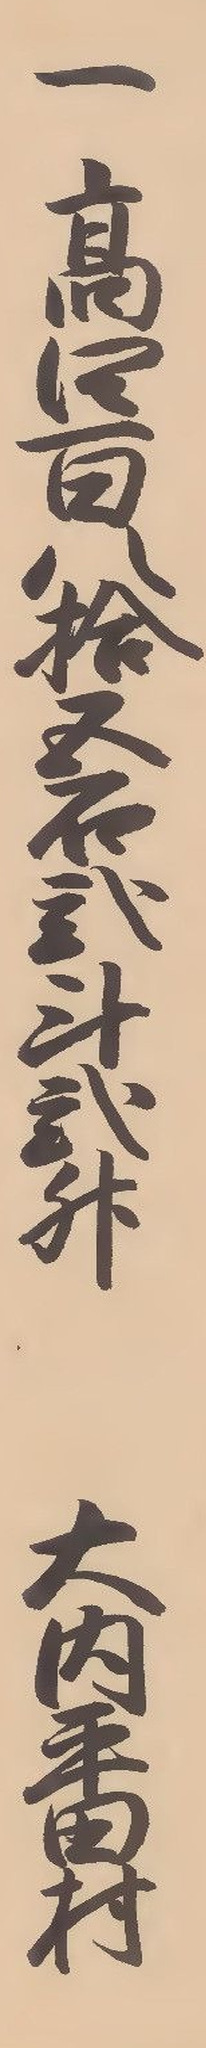一高四百八拾五石弐斗弐升大内平田村
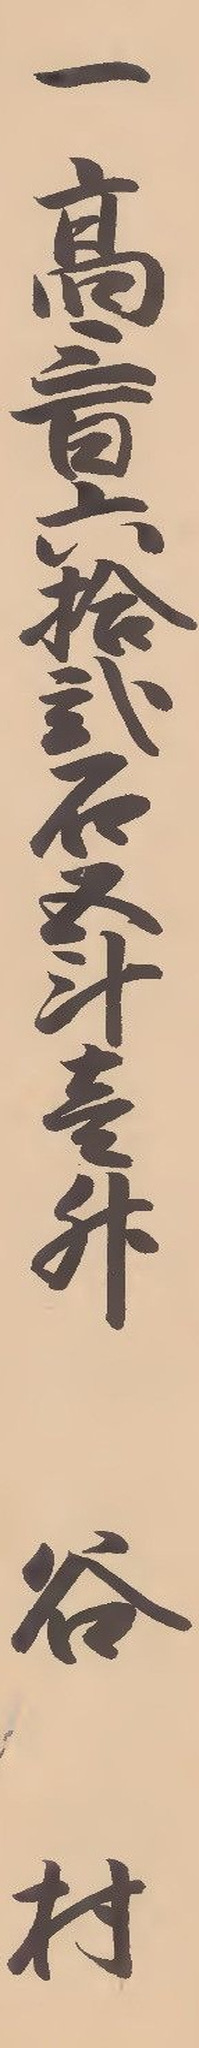一高三百六拾弐石五斗壱升谷村
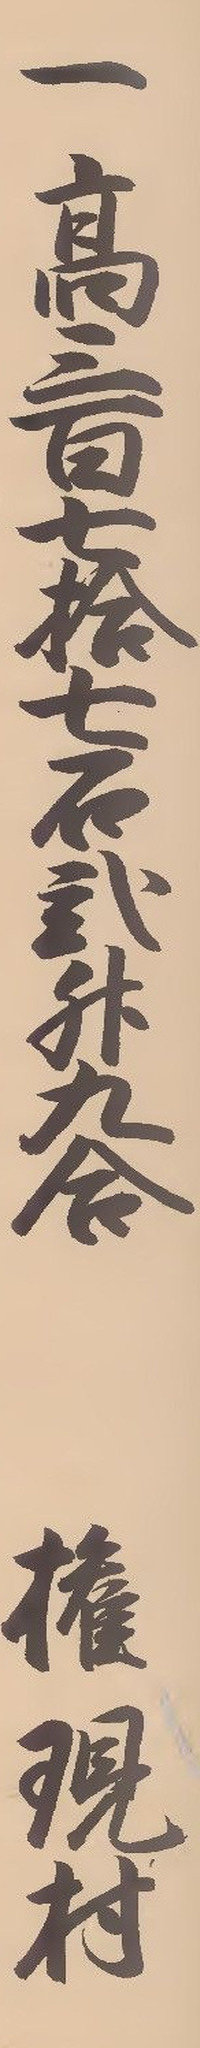一高三百七拾七石弐升九合権現村
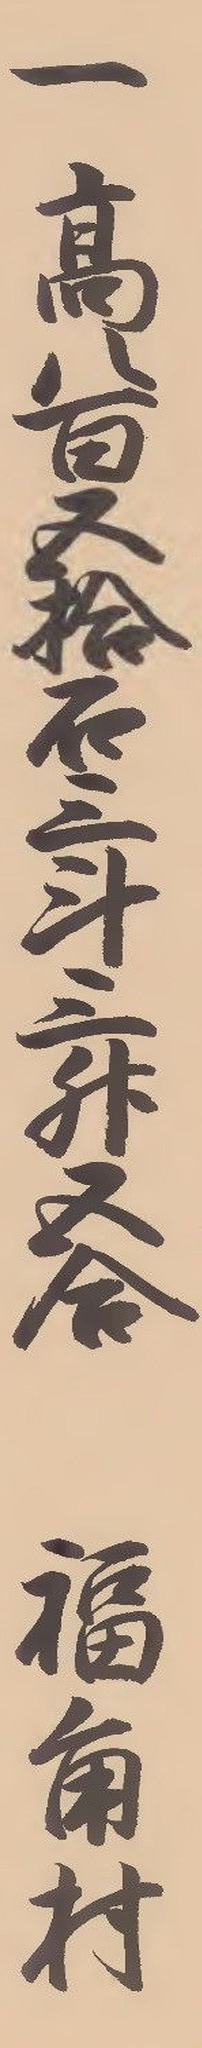一高八百五拾石三斗三升五合福角村
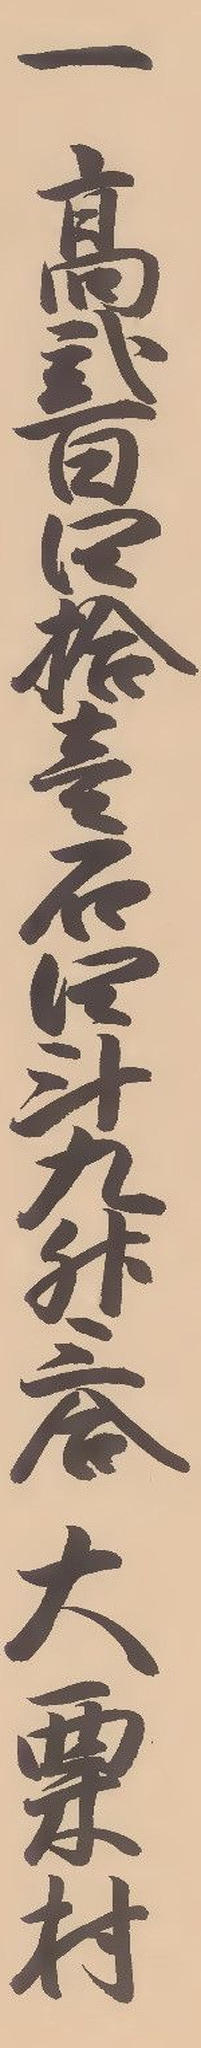一高弐百四拾壱石四斗九升三合大栗村
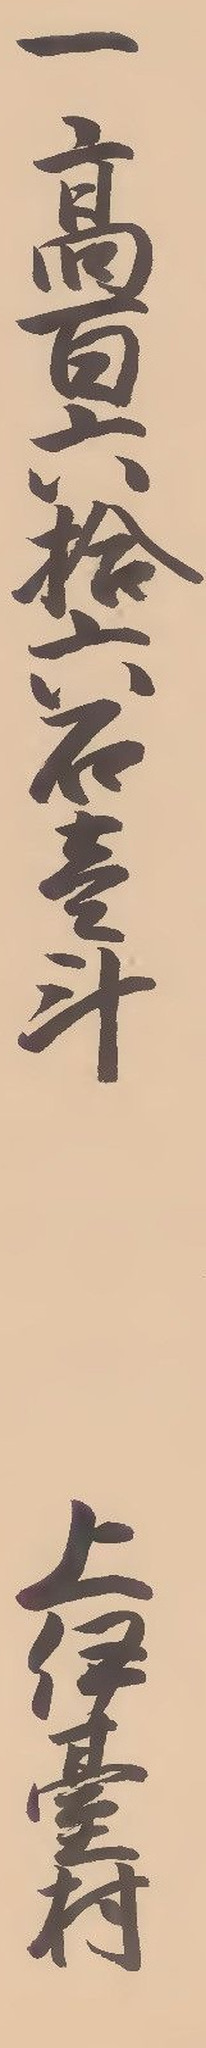一高百六拾六石壱斗上伊台村
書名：伊予国郷帳
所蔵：国立公文書館 National Archives of Japan
